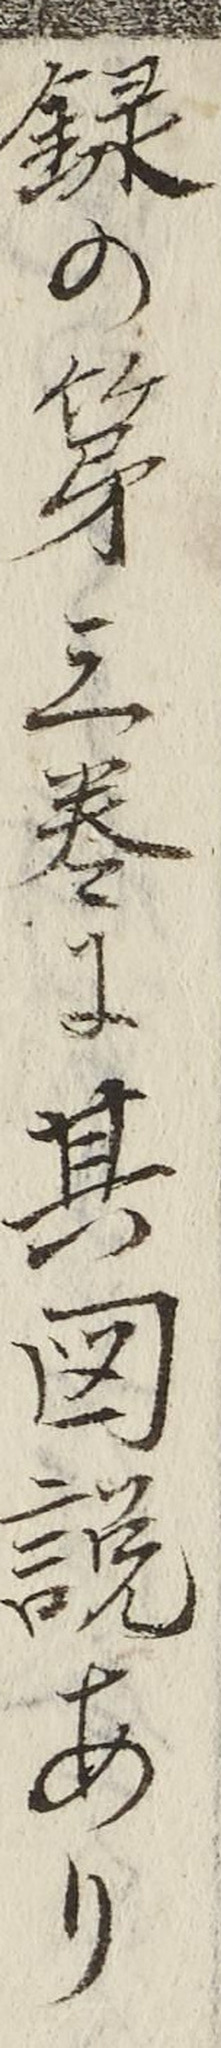録の第三巻に其図説あり

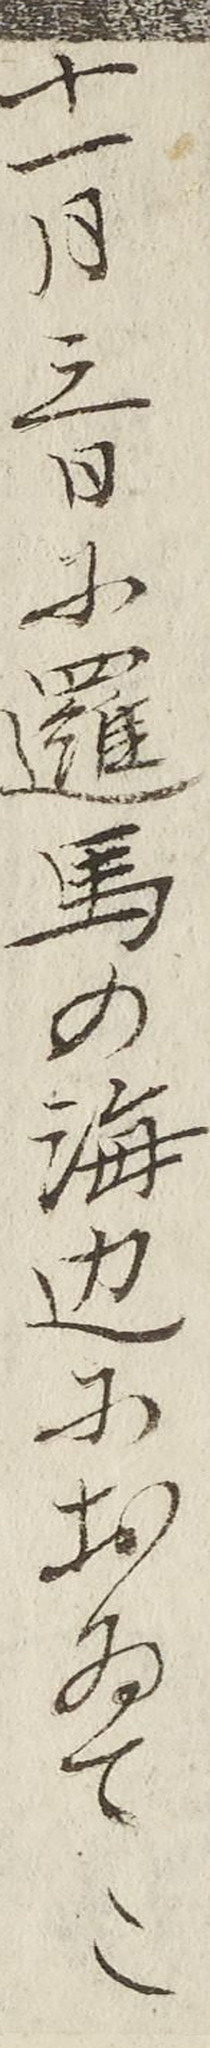十一月三日に羅馬の海辺におゐてこ
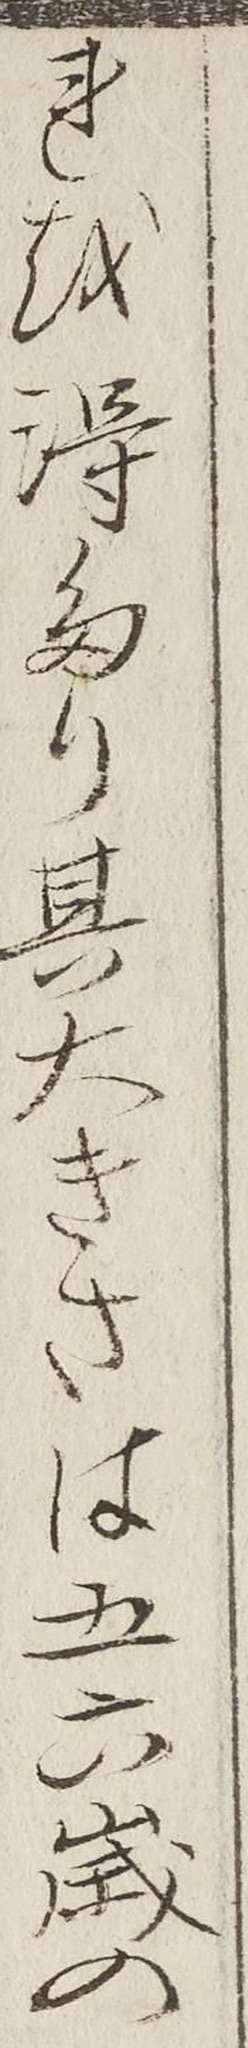れを得たり其大きさは五六歳の
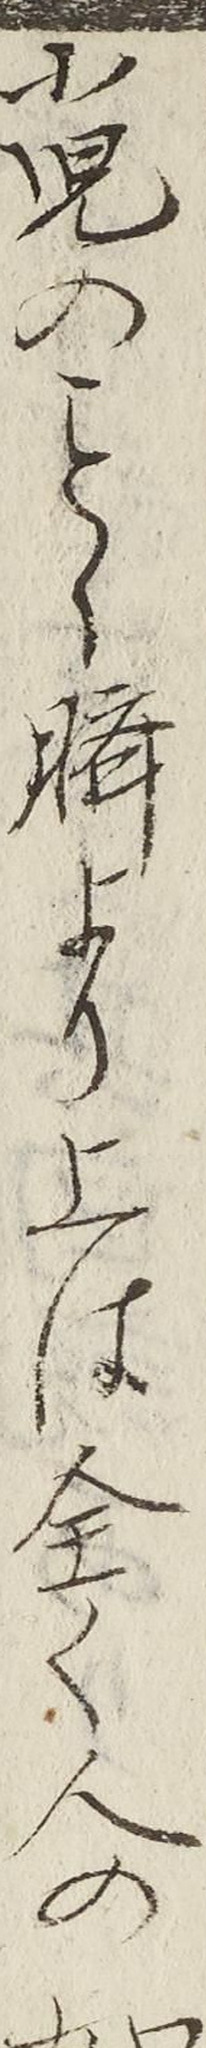小児のことく臍より上は全く人の如
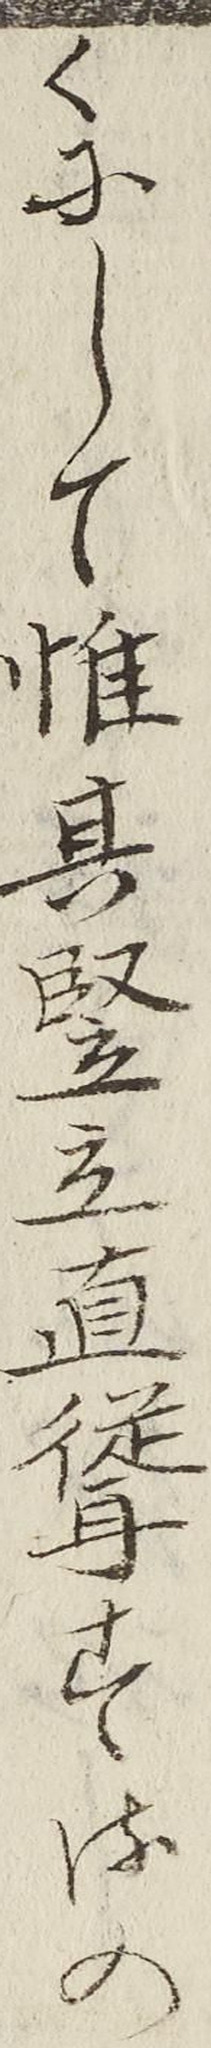くにして唯其竪立直聳するの
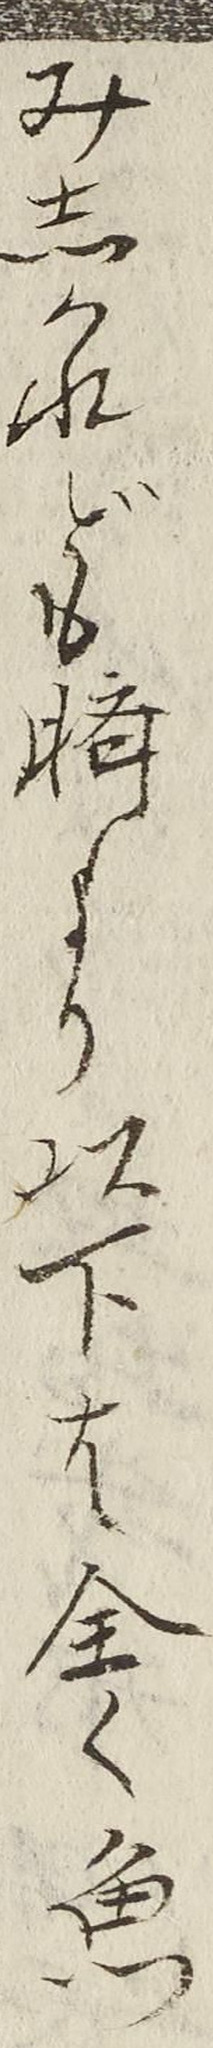みしかれども臍より以下は全く魚
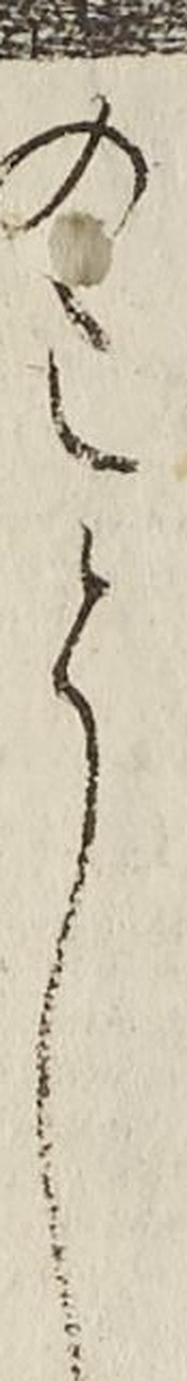のことし
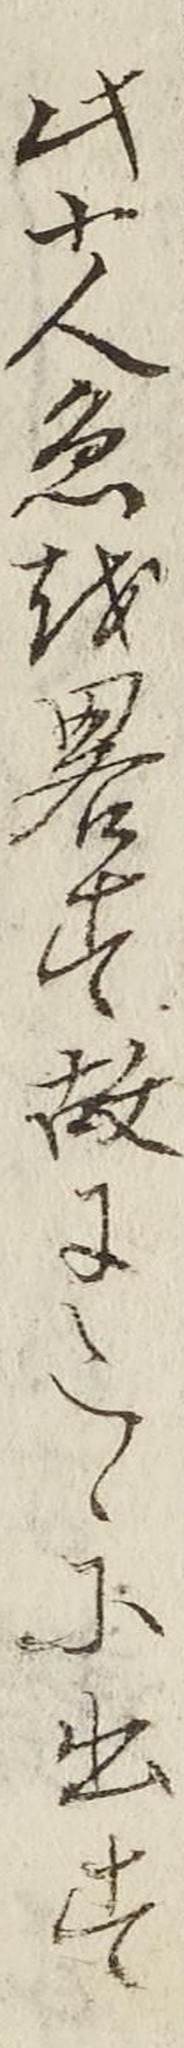此小人魚を畧す故にこゝに出す
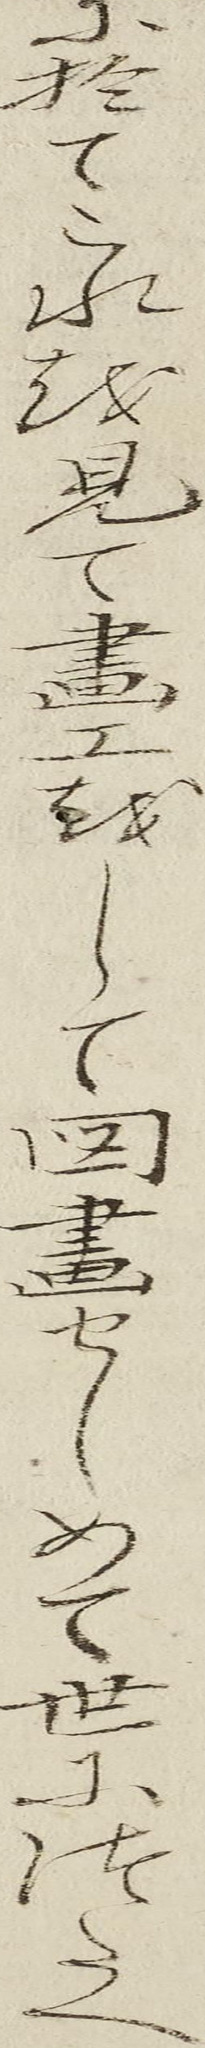におゐてこれを見て画工をして図画せしめて世につたへ
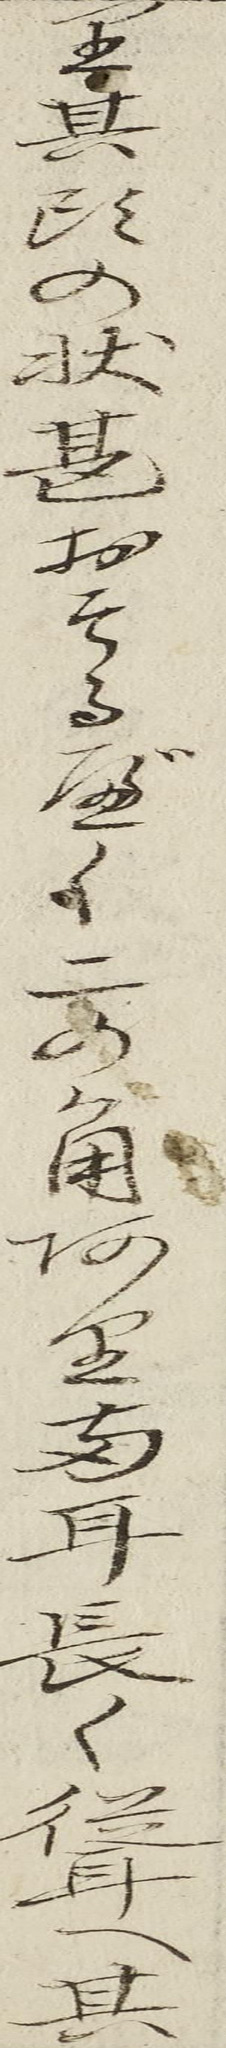リ其頭の状甚おそるべく二の角あり両耳長く聳へ其
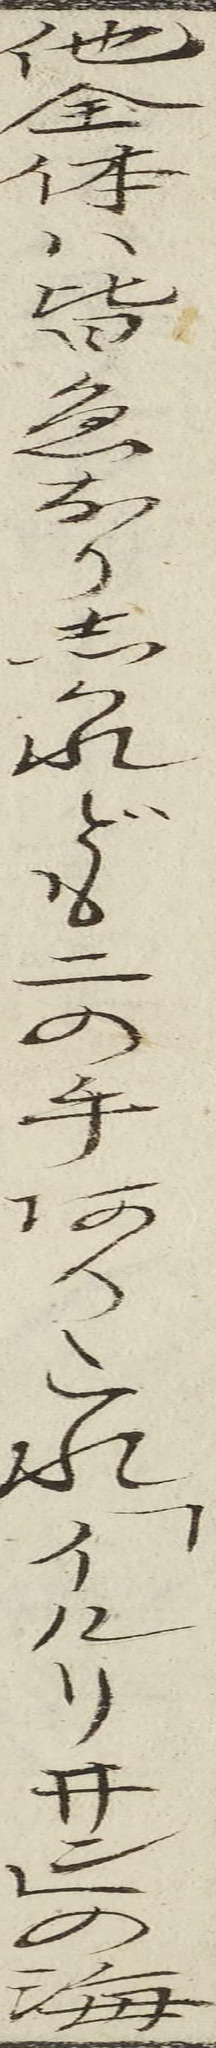他全体ハ皆急なりしかれども二の手ありこれ「イルリ井ン」の海
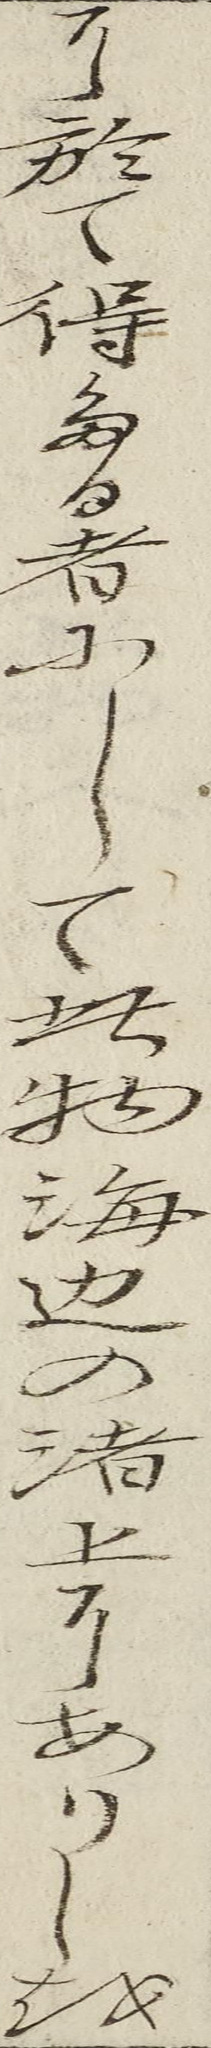に於て得たる者にして此物海辺の渚上にありしを
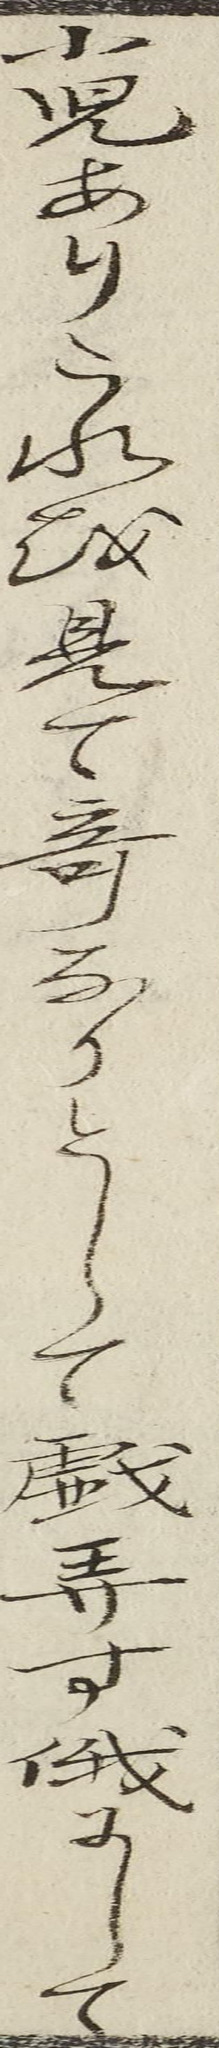小児ありこれを見て奇なりとして戯喜す俄にして
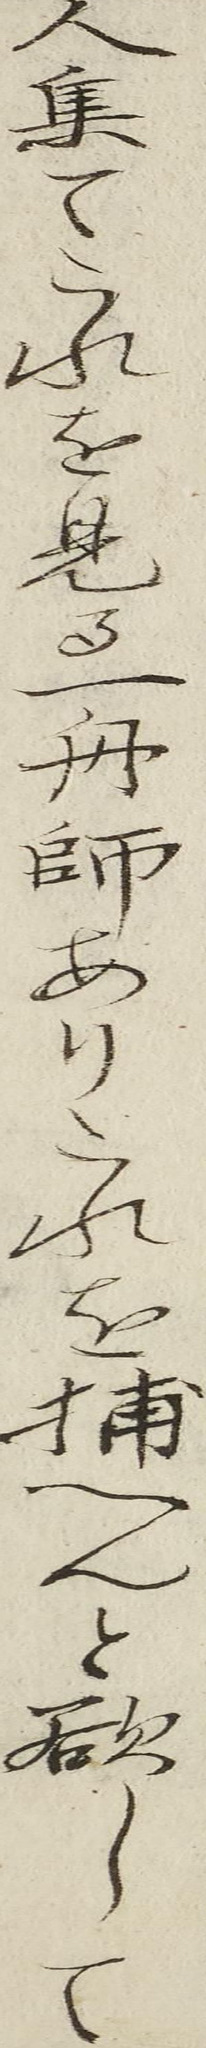人集てこれを見る一舟師ありこれを捕へんと欲して
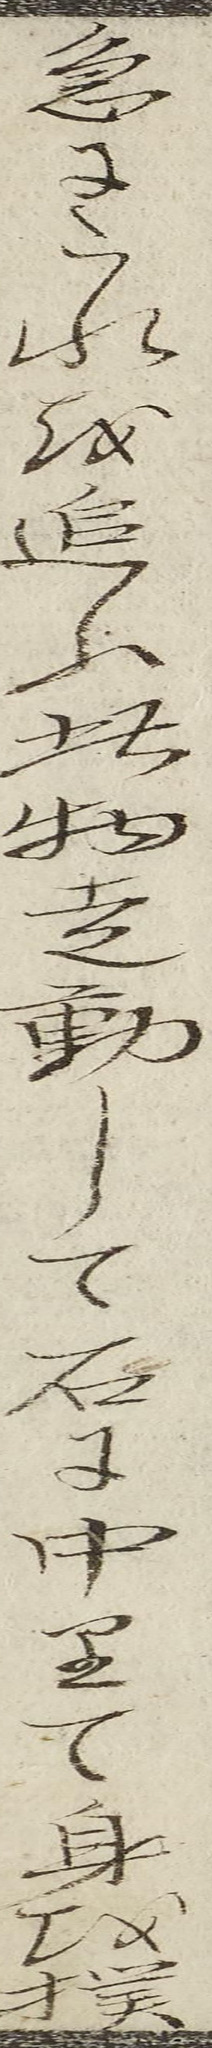急にこれを追ふ此物走動して石に中りて身を撲
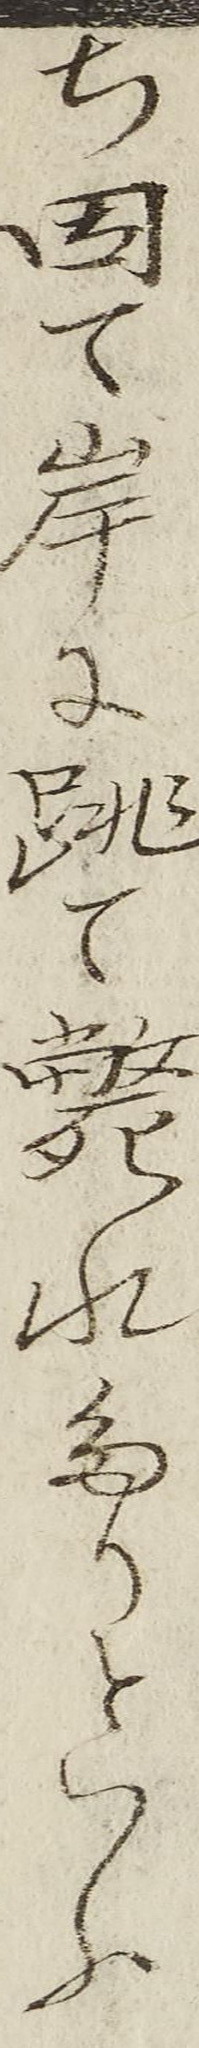ち因て岸に跳て斃れたりといふ
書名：西洋雜記　乾
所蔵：東京大学地震研究所図書室 Earthquake Research Institute Library, The University of Tokyo, JAPAN
